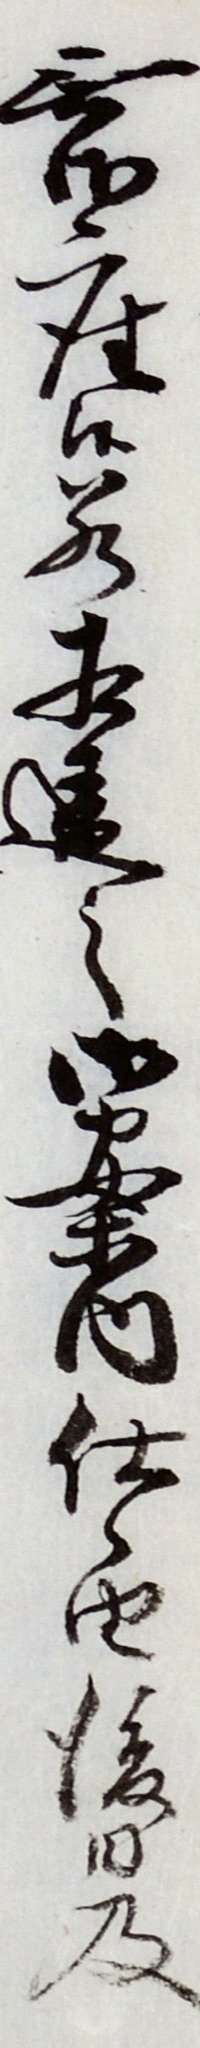無御座候若相違之御案内仕候由後日及
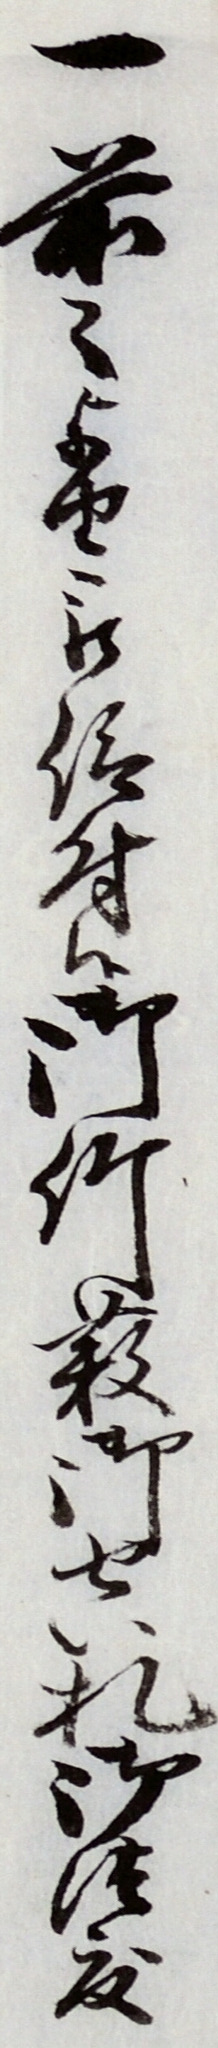一前々より被仰付候御竹薮御せい札御法度
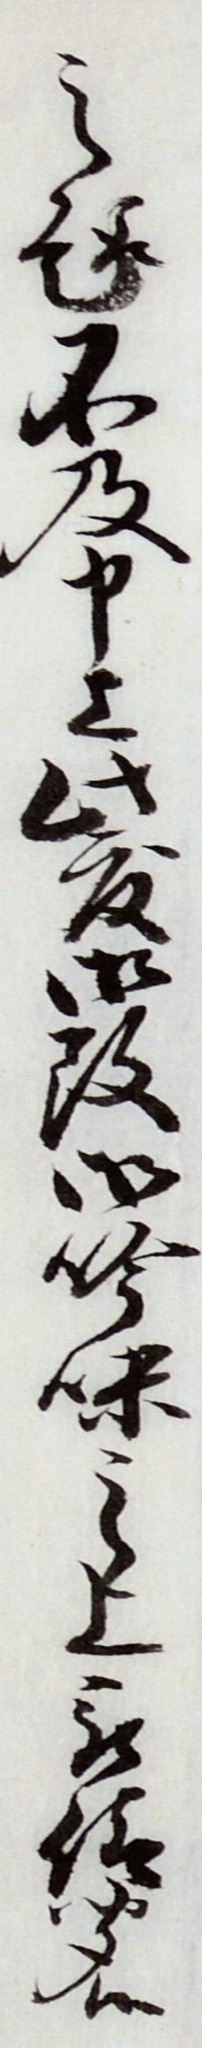之趣不及申上此度御改御吟味之上被仰聞候
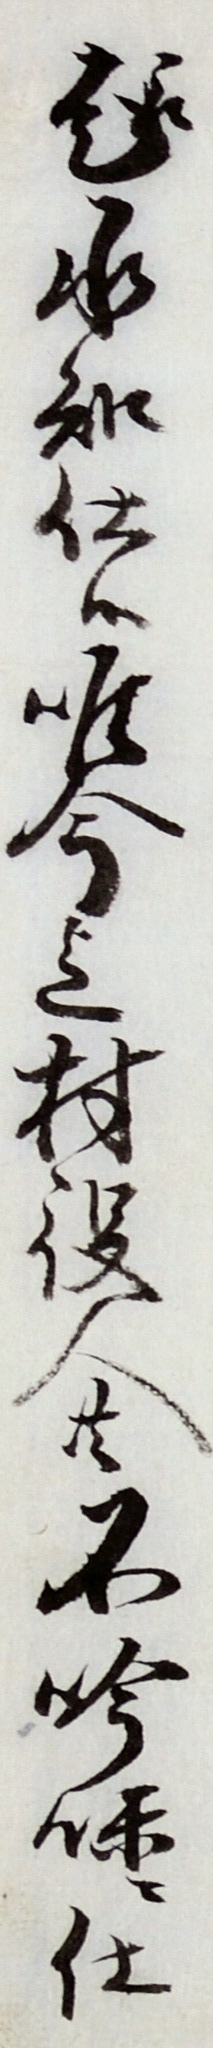趣承知仕候唯今迄村役人共不吟味ニ仕

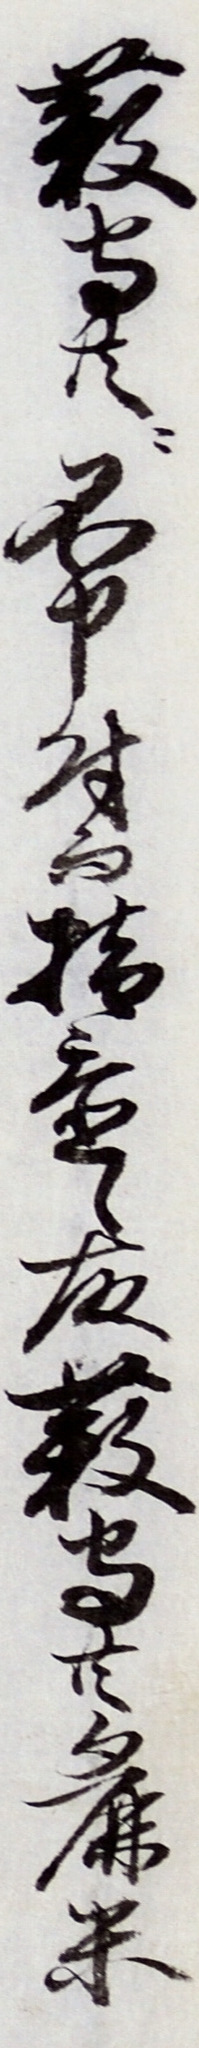薮守共ニ不申付而指置候故薮守共麁末
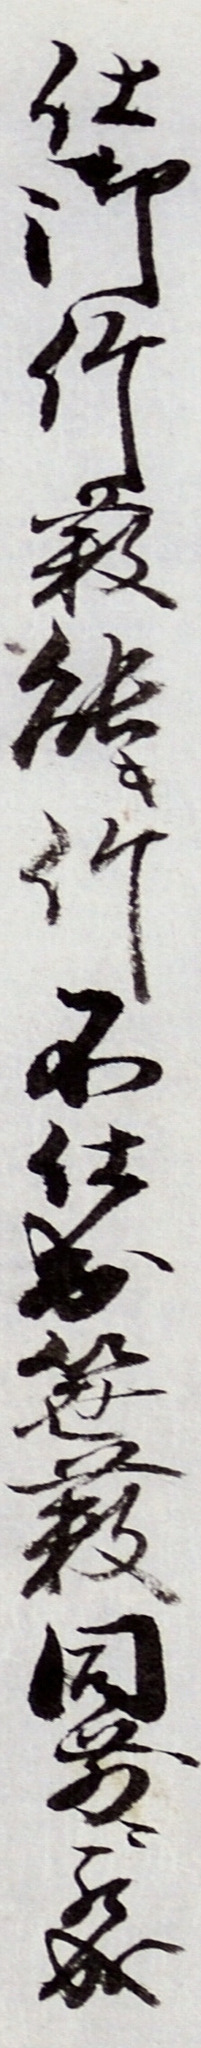仕御竹薮能キ竹不仕出笹薮同前ニ罷成
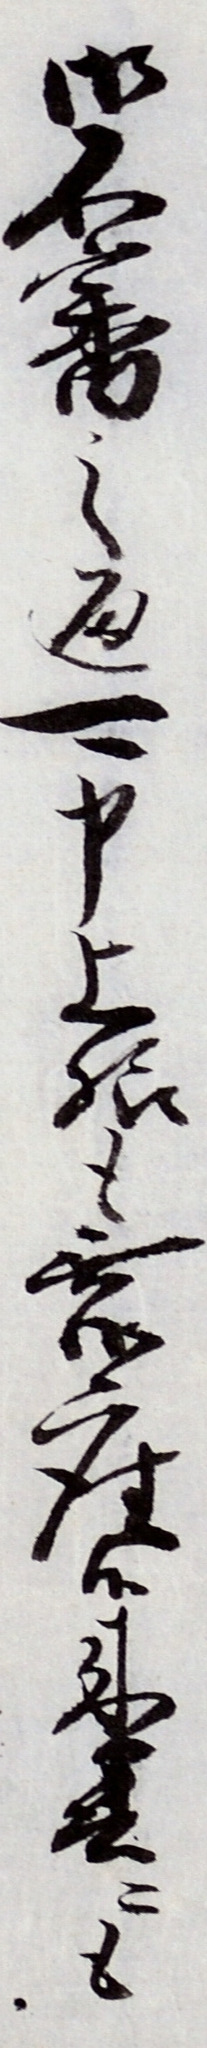御不審之通可申上様も無御座候来春ニも
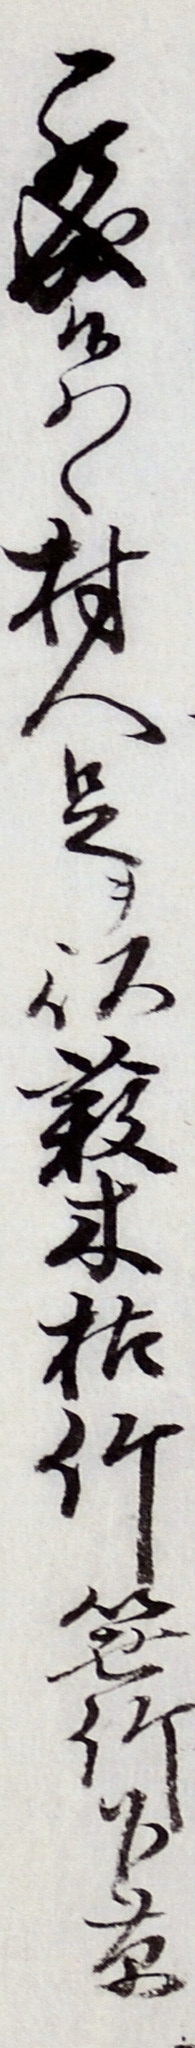罷成候ハヽ村人足ヲ以薮木枯竹笹竹下草
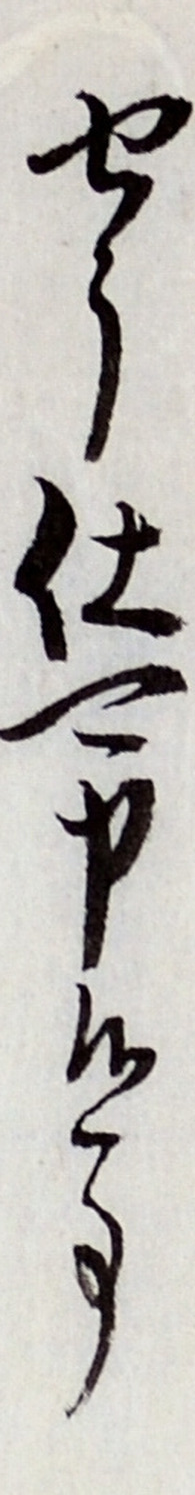せう仕可申候事
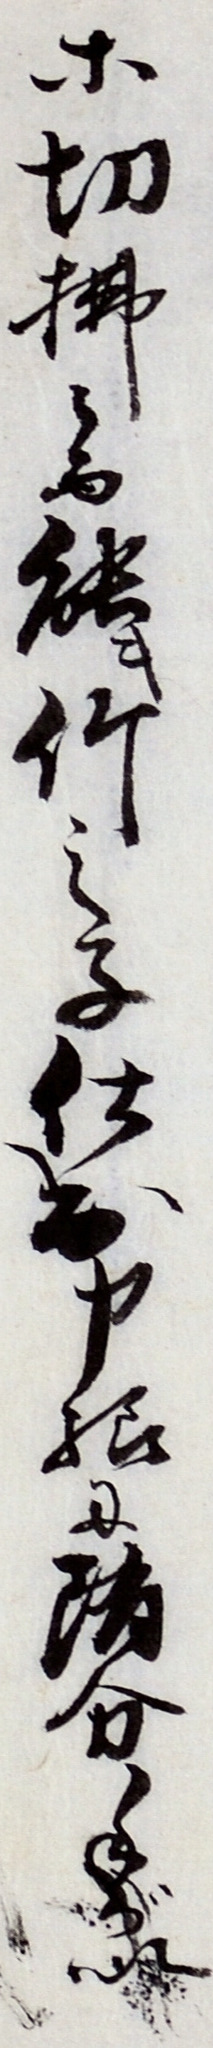等切払ニ而能キ竹之子仕出申様に随分手がい
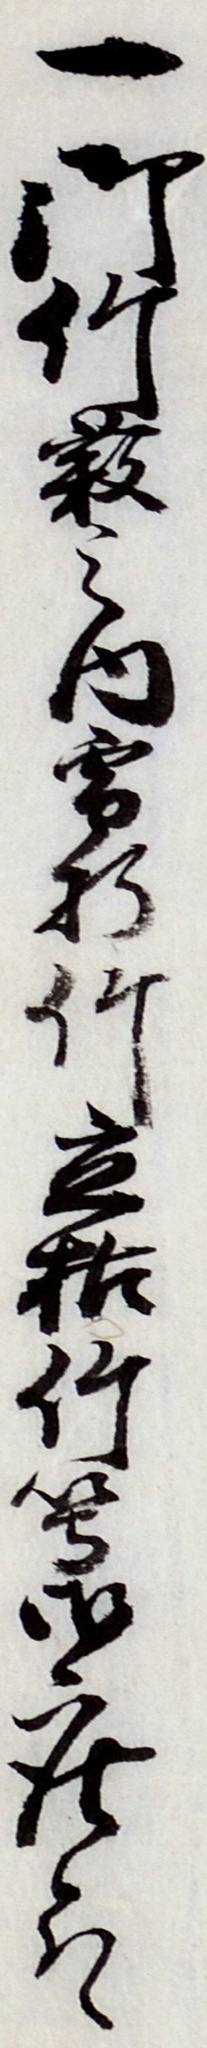一御竹薮之内雪折竹立枯竹等御座候ハヽ
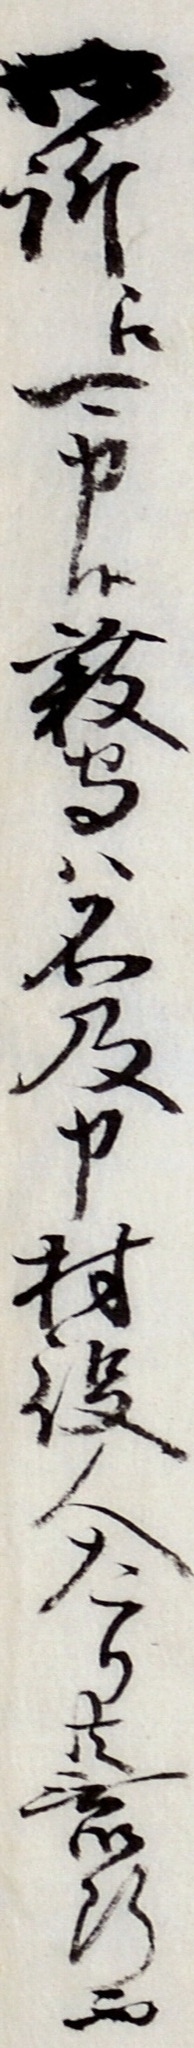御所え可申候薮守ハ不及申村役人たり共無御断而
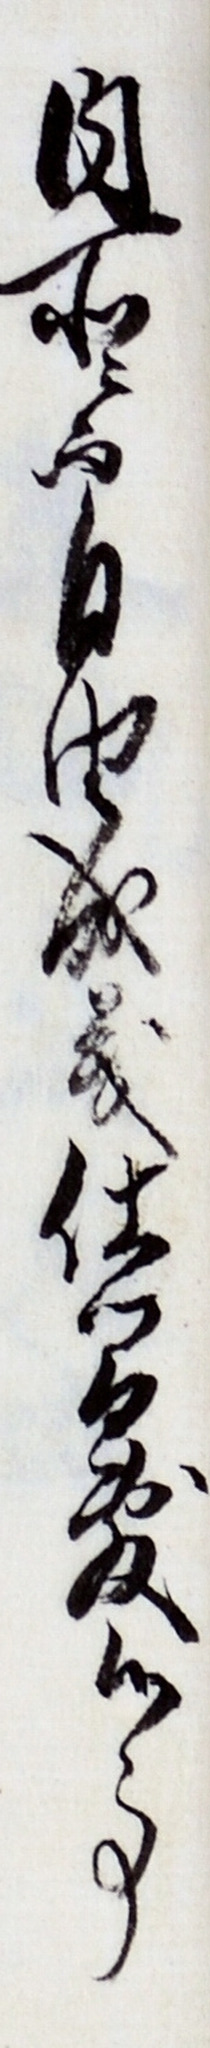内所ニ而自由成義仕間敷候事
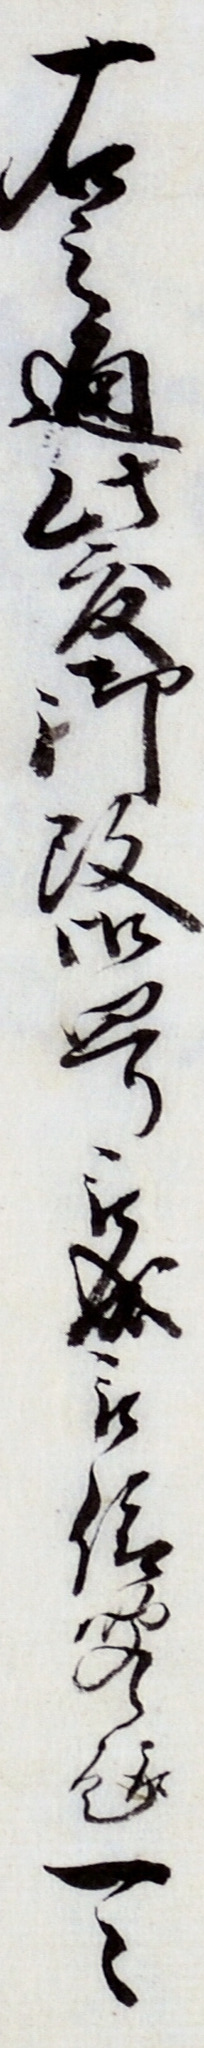右之通此度御改御廻り被成被仰聞趣一々
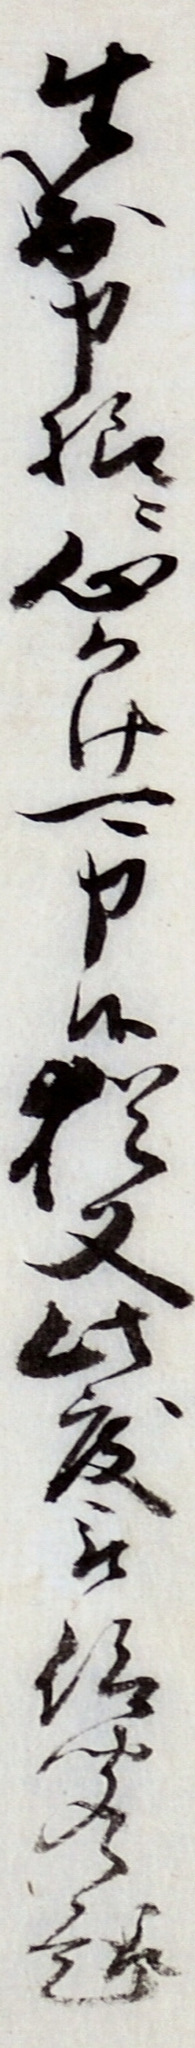生出申様ニ心かけ可申候猶又此度被仰聞候趣
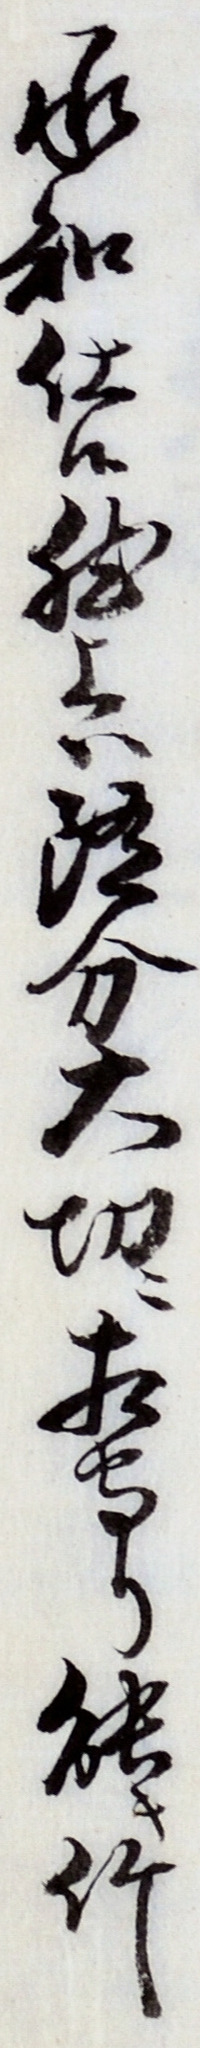承知仕候然上ハ随分大切ニ相守り能キ竹
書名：御林御竹藪証文控
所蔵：伊那市立高遠町図書館・合同会社AMANE
